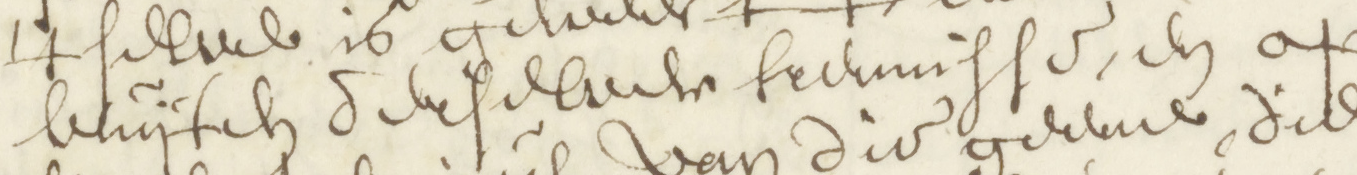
buijten derselver kennisse, en op
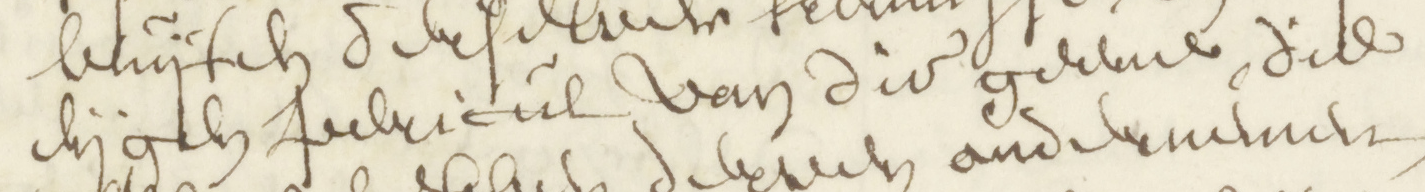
eijgen pericul van die geene, die
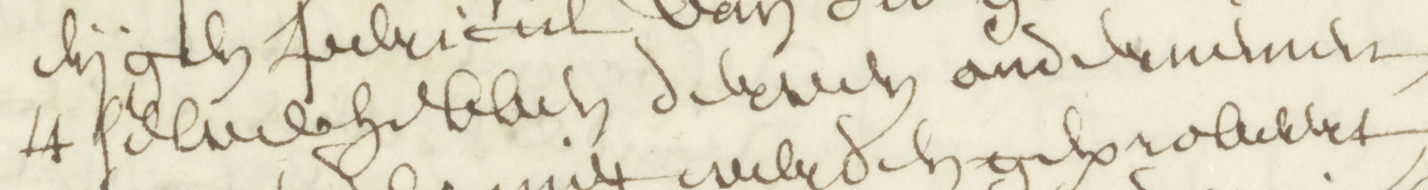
't selve hebben derven ondernemen
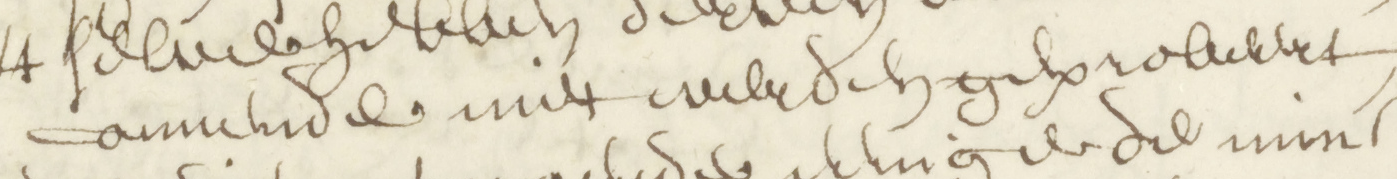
connende niet werden geprobeert
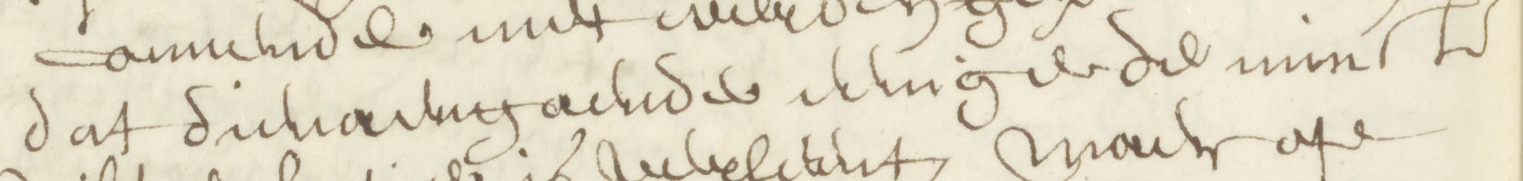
dat dienaengaende eenige de minste
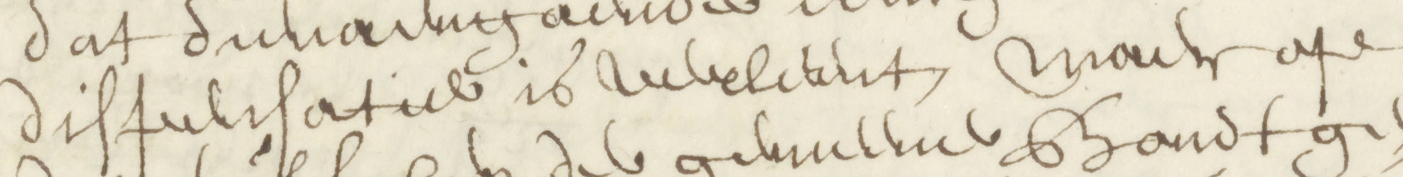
dispensatie is verleent, maer op
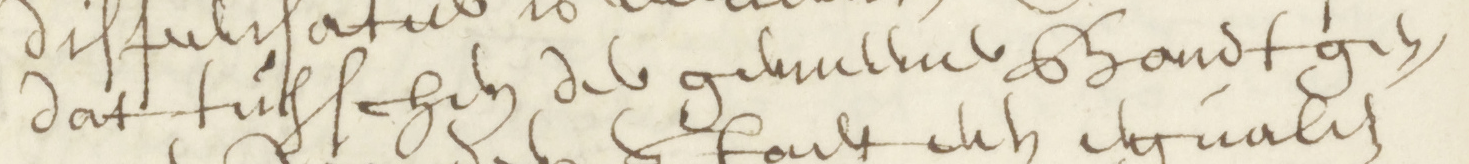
dat tussschen de gemeene Bondt ge,,
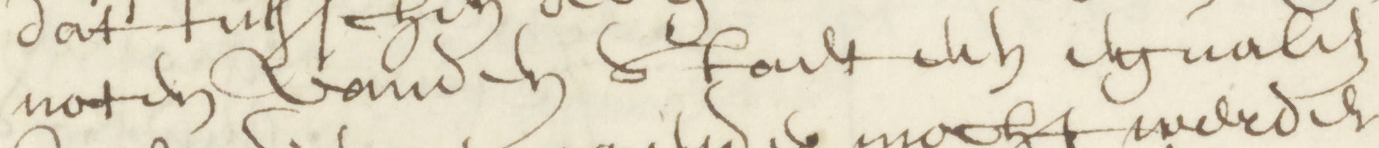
noten vanden Staet een egualen
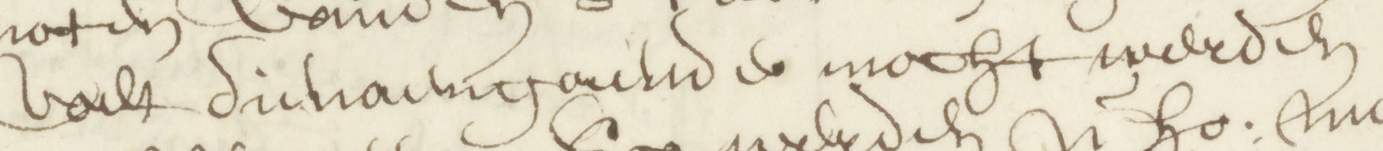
voet dienaengaende mocht werden
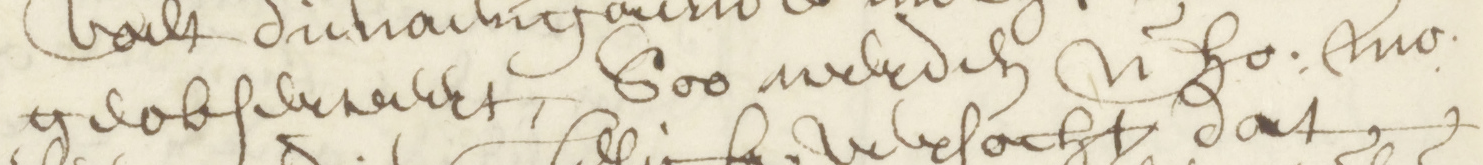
geobservert, soo werden U Ho:Mo:
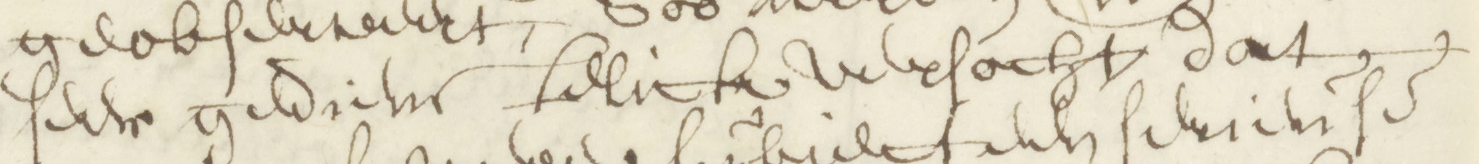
seer gedienstelick versocht, dat
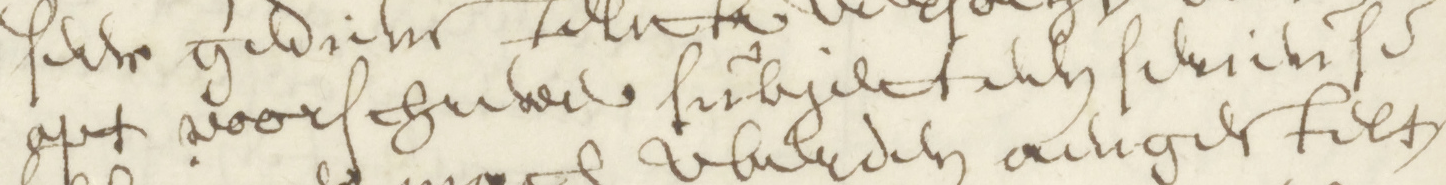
opt voorschreve subject een serieuse
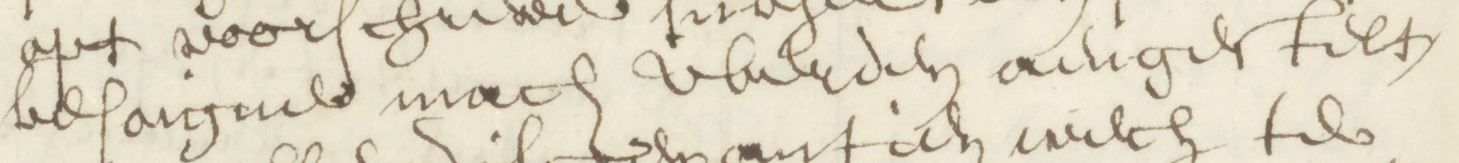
besoigne mach werden aengestelt,
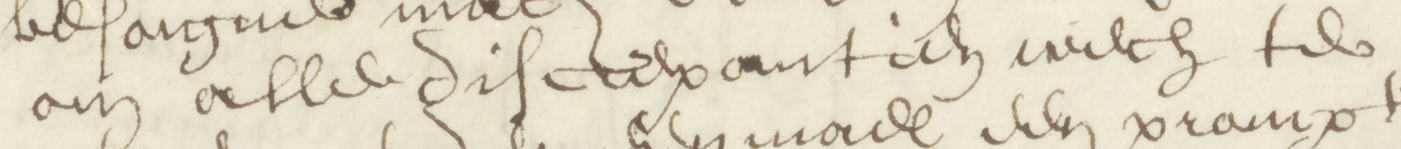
om alle discrepantien wech te
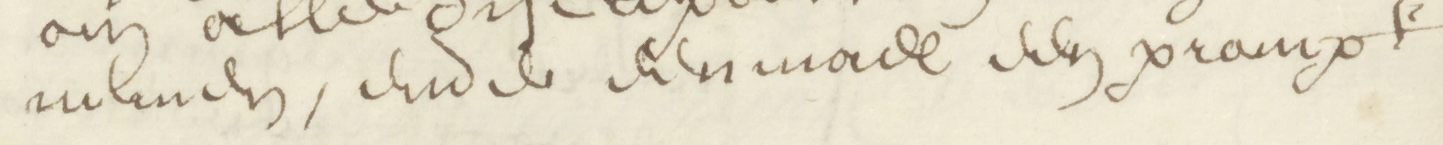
nemen, ende eenmael een prompt
